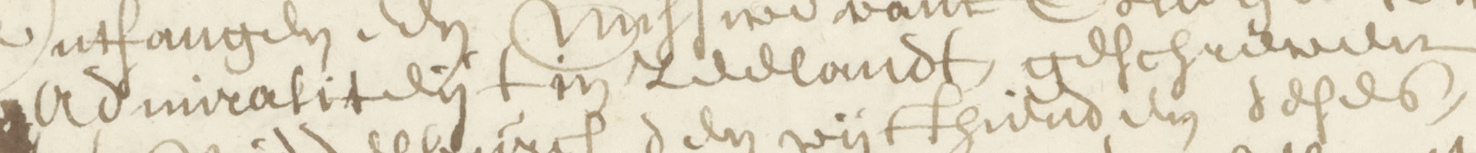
Admiraliteijt in Zeelandt, geschreven
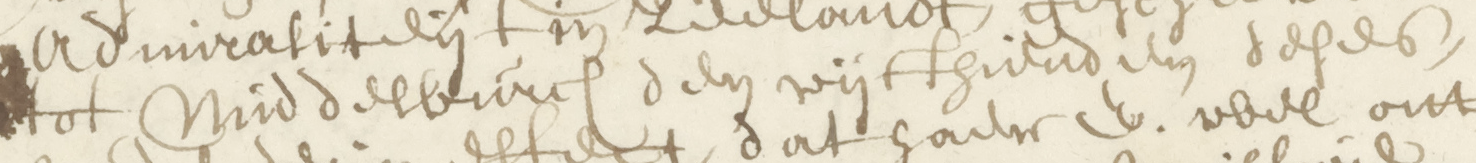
tot Middelburch den vijfthienden deses,
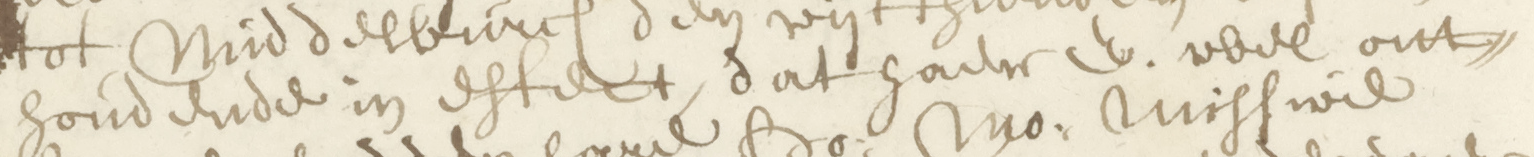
houdende in effect, dat haer E. wel ont„
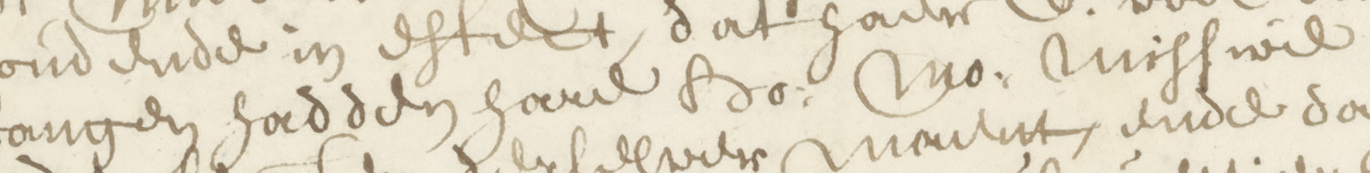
fangen hadden hare Ho:Mo: Missive
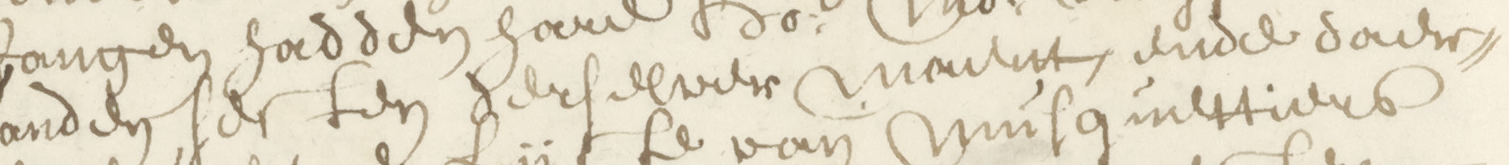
vanden sesten derselver maent, ende daer„
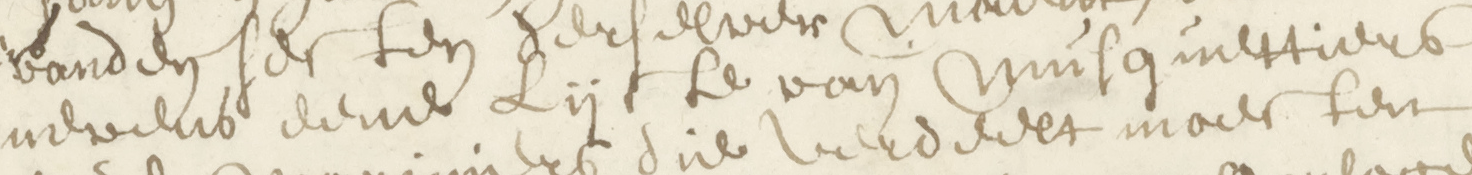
nevens eene Lijste van musquettiers
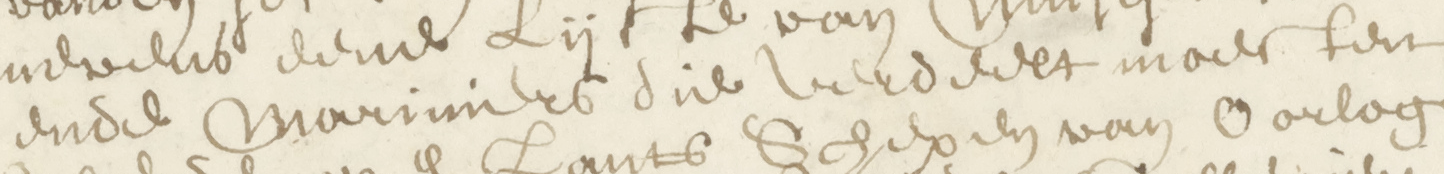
ende mariniers die verdeelt moesten
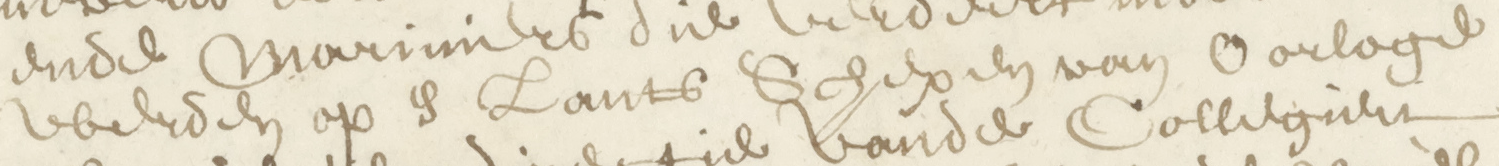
werden op 's Lants Schepen van Oorloge
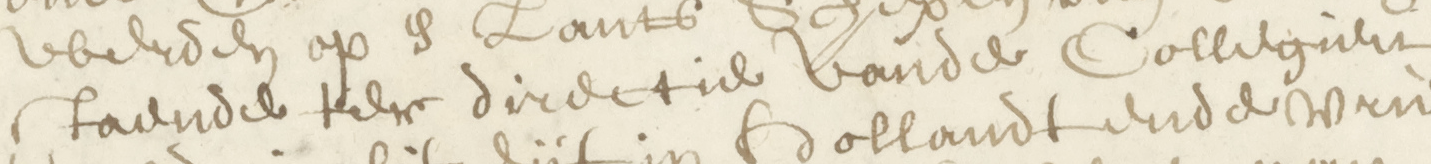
staende ter directie vande Collegien
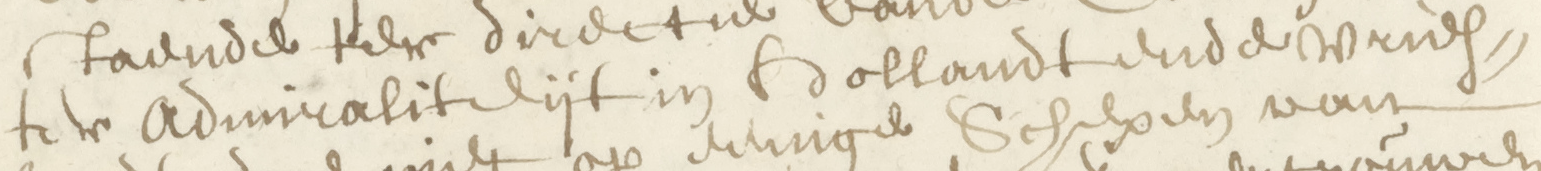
ter Admiraliteijt in Hollandt ende Vries„
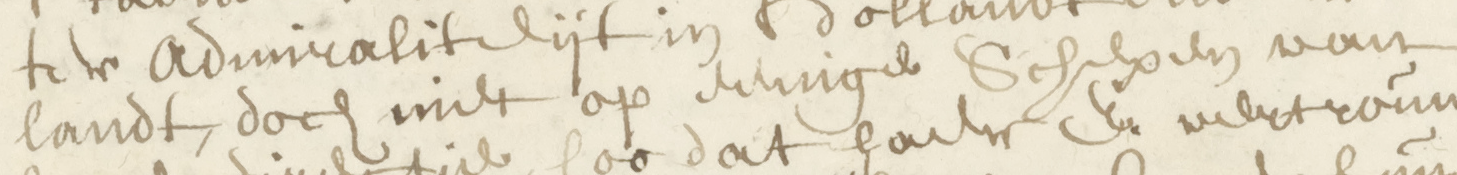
landt, doch niet op eenige Schepen van
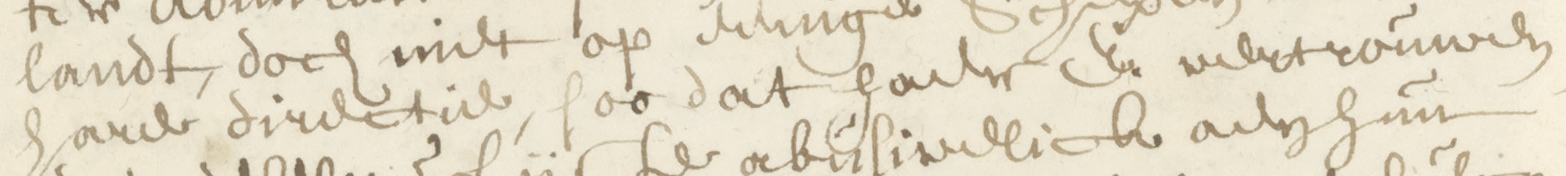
hare directie, soo dat haer E. vertrouwen
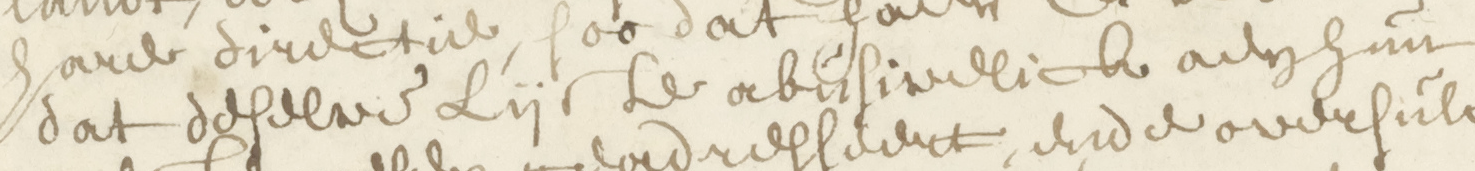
dat deselve Lijste abusivelick aen hun
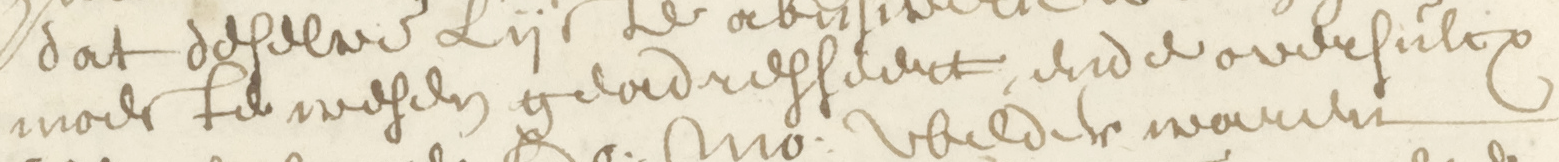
moeste wesen geadresseert, ende oversulcx
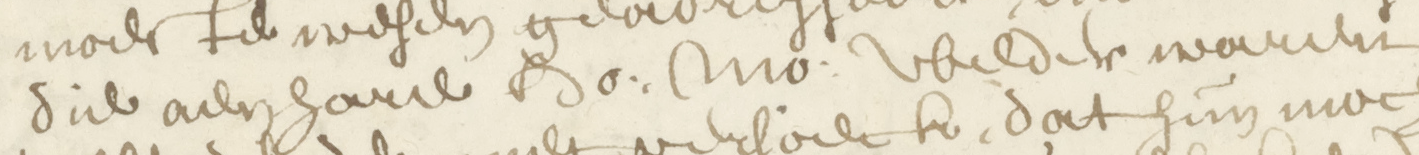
die aen hare Ho:Mo: weder waren
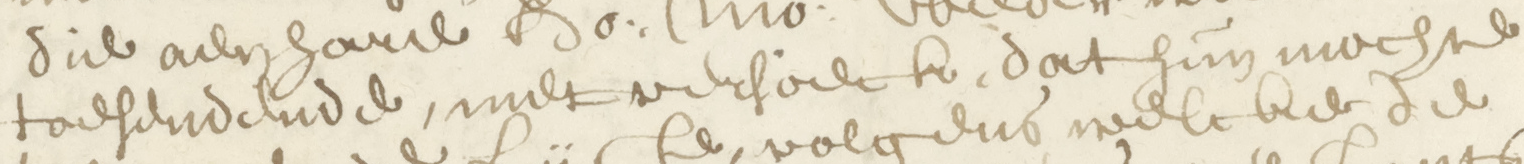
toesendende, met versoeck, dat hun mochte
